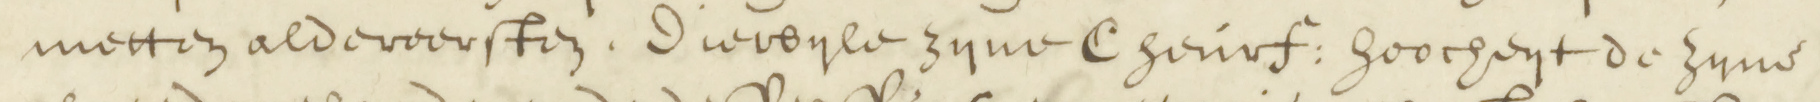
metten aldereersten, diewyle zyne Cheurf: hoocheyt de zyne
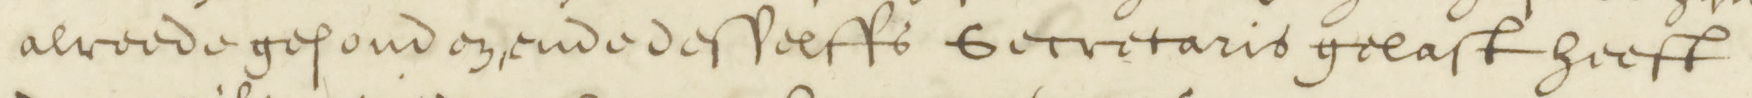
alreede gesonden, ende desselffs secretaris gelast heeft
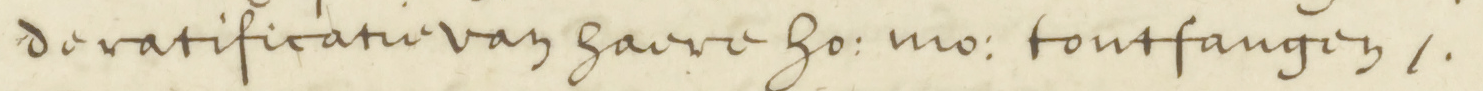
de ratificatie van haere Ho:Mo: tontfangen.
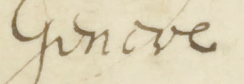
Geneve
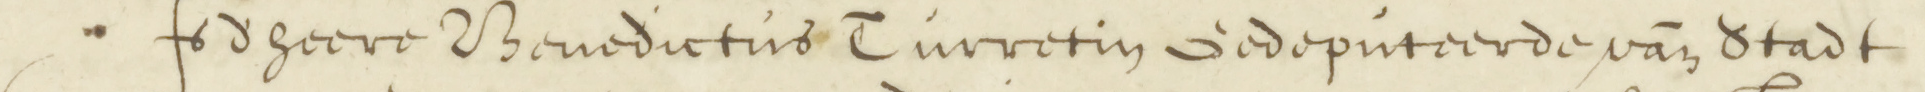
Is d'heere Benedictus Turretin Gedeputeerde van Stadt
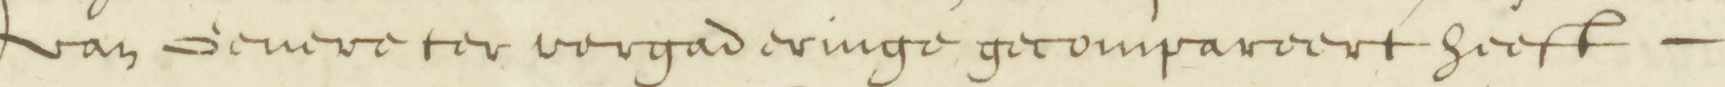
van Geneve ter vergaderinge gecompareert heeft -
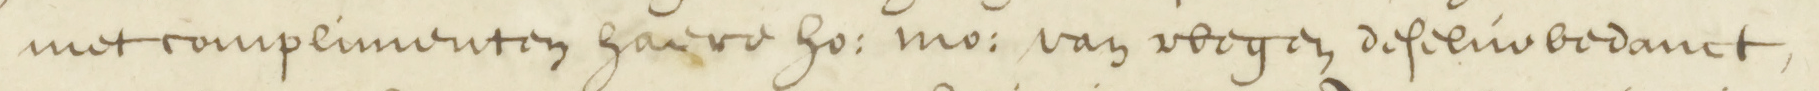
met complimenten haere Ho:Mo: van wegen deselue bedanct,
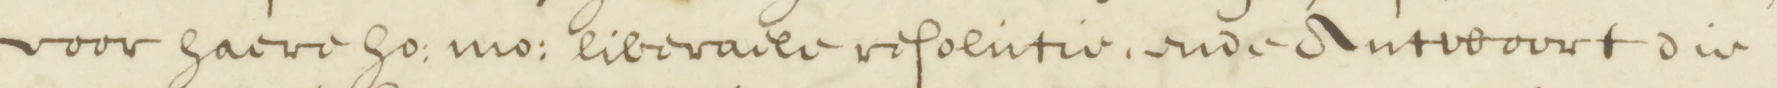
voor haere Ho:Mo: liberale resolutie, ende Antwoort die
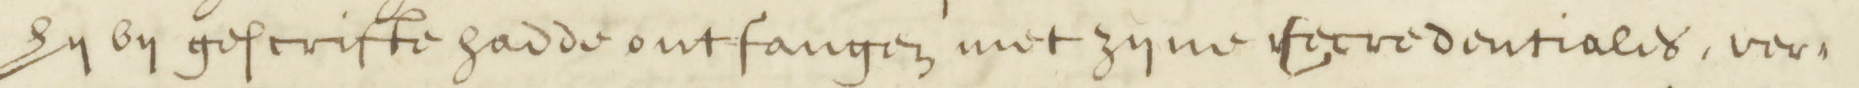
zy by gescrifte hadde ontfangen met zyne secredentialis, ver„
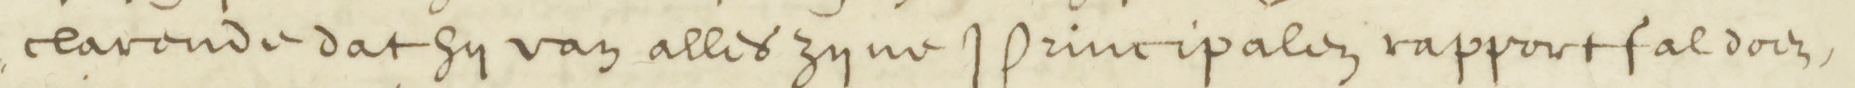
,,clarende dat hy van alles zyne principalen rapport sal doen,
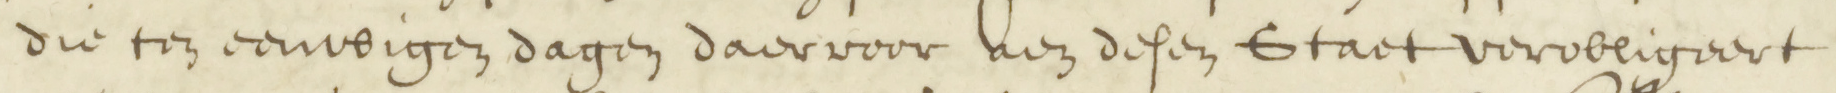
die ten eeuwigen dagen daervoor aen desen Staet verobligeert
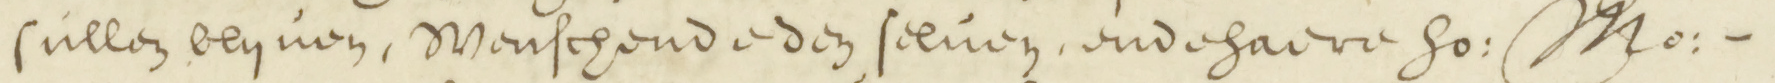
sullen blyuen, wenschende den seluen ende haere Ho:Mo:
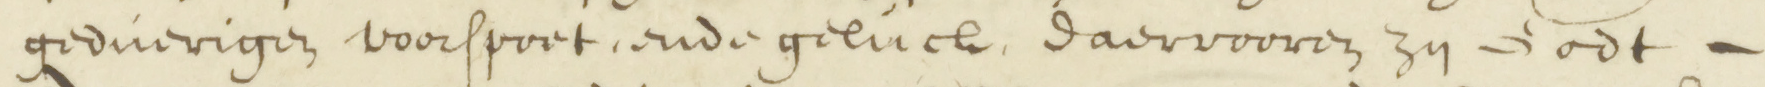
geduerigen voorspoet ende geluck, daervooren zy Godt -
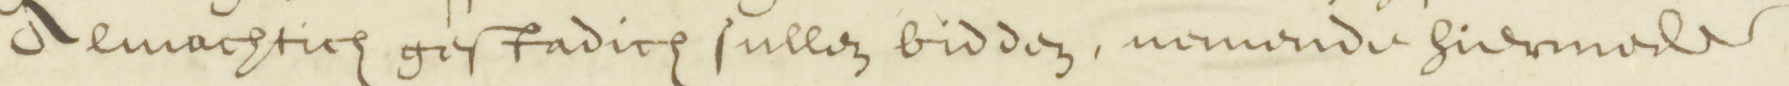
Almachtich gestadich sullen bidden, nemende hiermede
